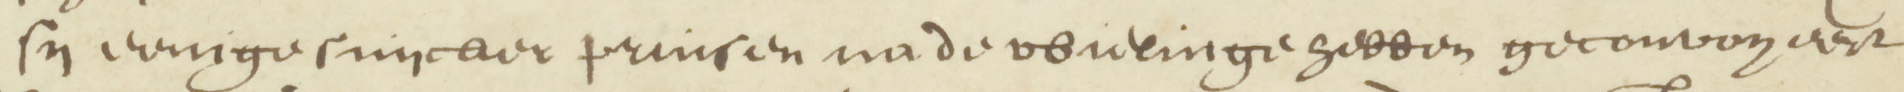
sy eenige suycker pruisen na de Wielinge hebben geconvoyeert
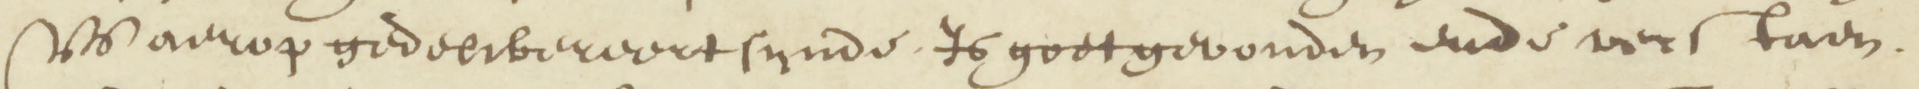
Waerop gedelibereert synde, Is goetgevonden ende verstaen
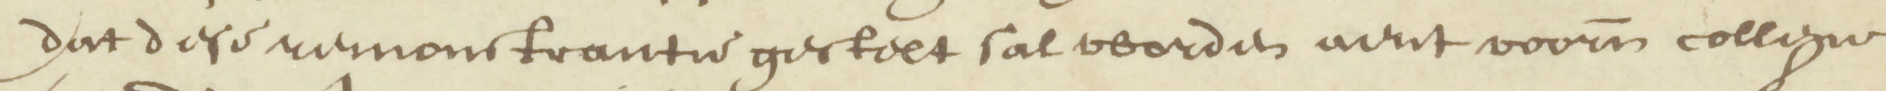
dat dese remonstrantie gestelt sal worden aent voorn collegie
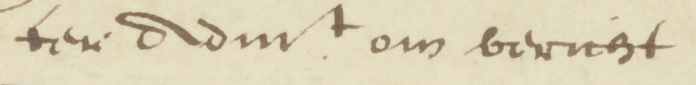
ter Admt om bericht
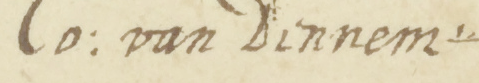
Co: van Dennem
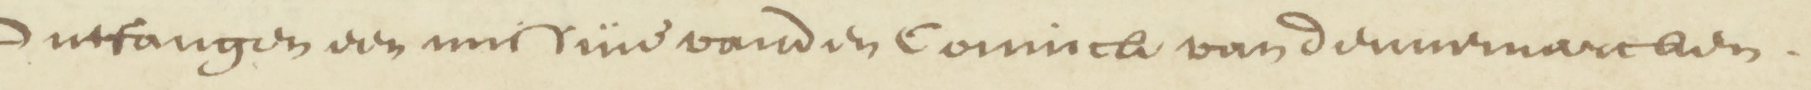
Ontfangen een missiue vanden Coninck van Dennemarcken
